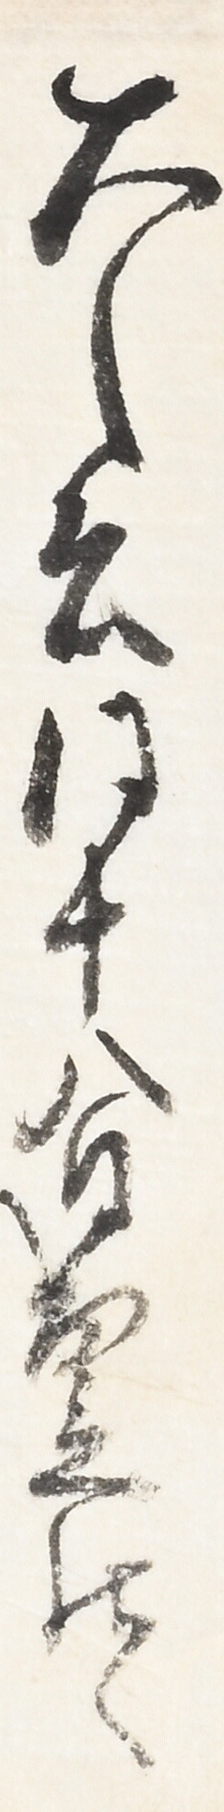右之者同十八日出立仕候
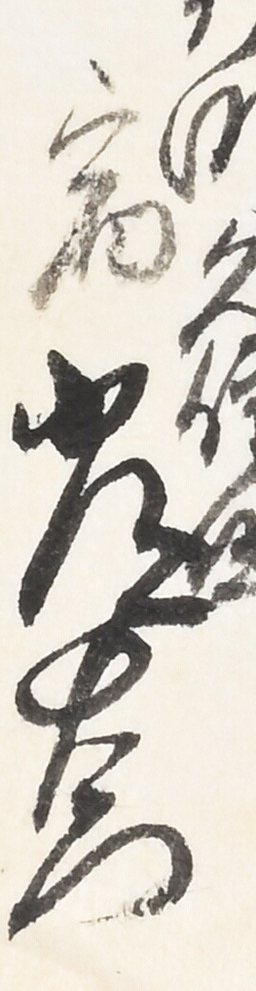宿常右衛門
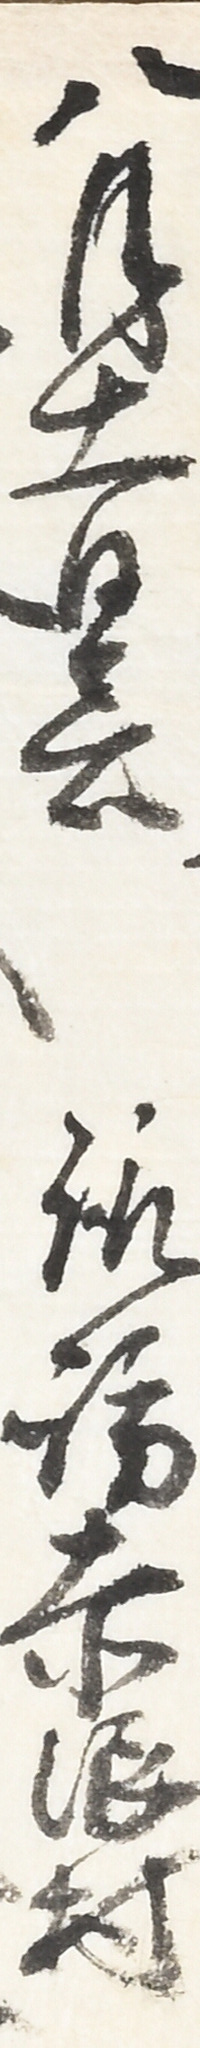八月十一日着諏訪赤根村
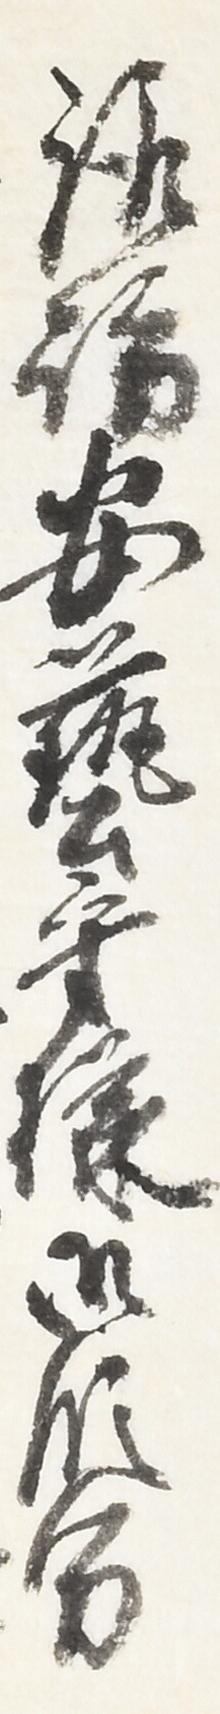諏訪安芸守様御領分
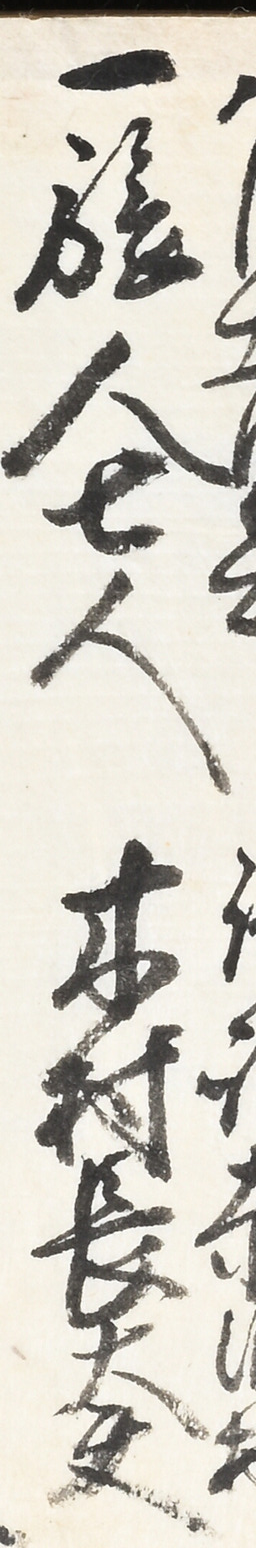一旅人七人本村長大夫
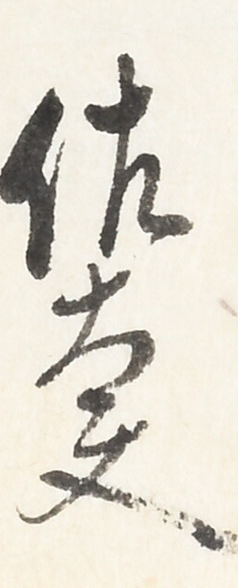佐大夫
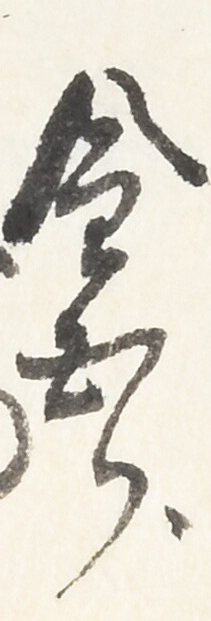金五郎
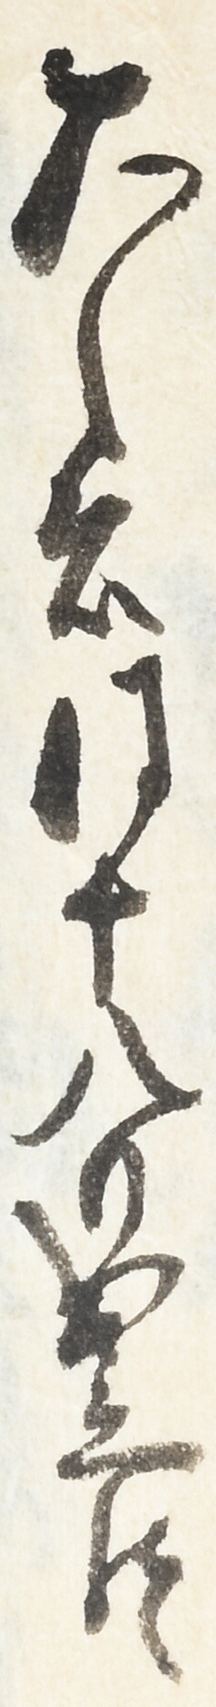右之者同十八日出立仕候

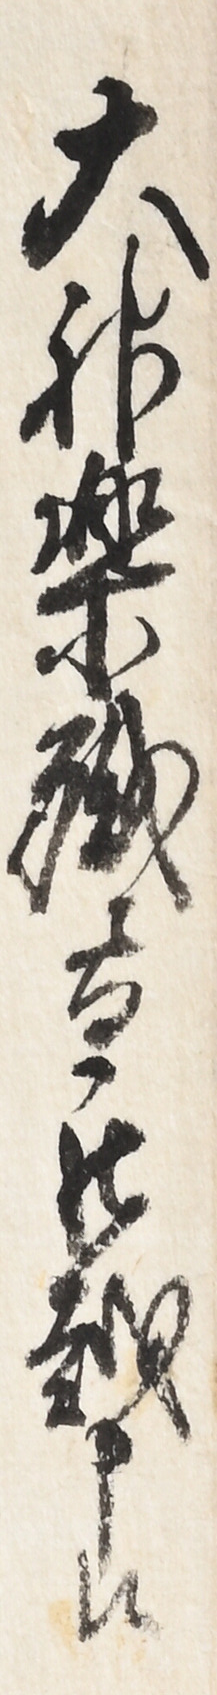大神楽職ニ而罷越申候
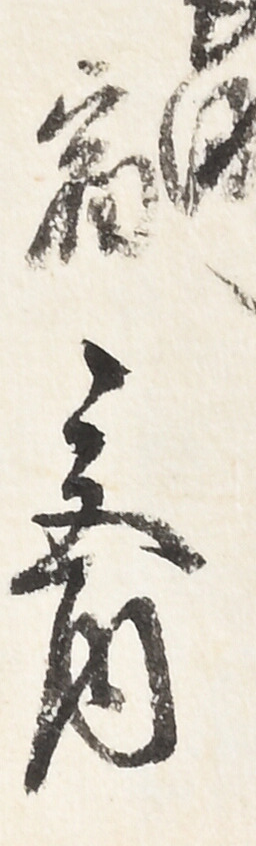宿宮内
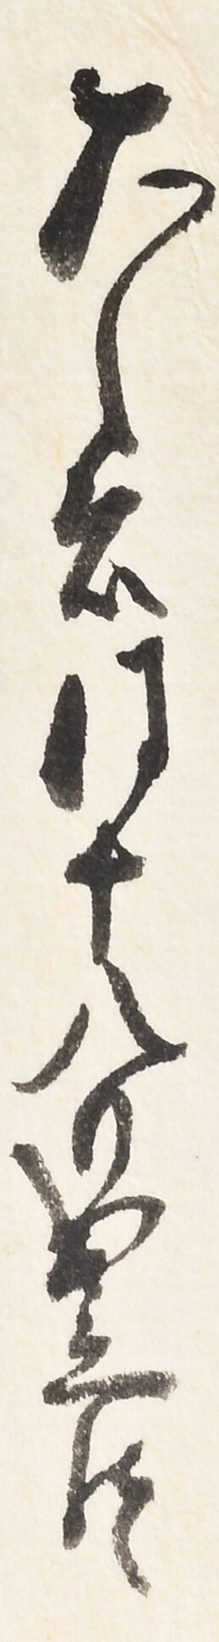右之者同十八日出立仕候
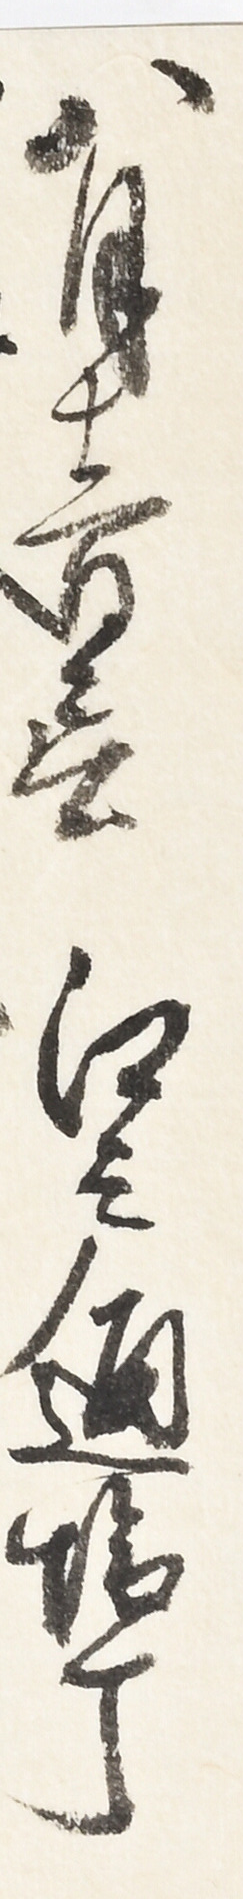八月十二日着江戸通塩丁
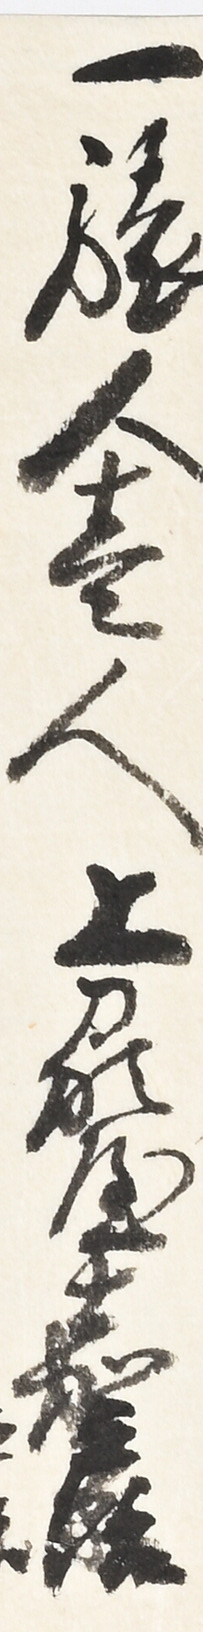一旅人壱人上州屋嘉兵衛
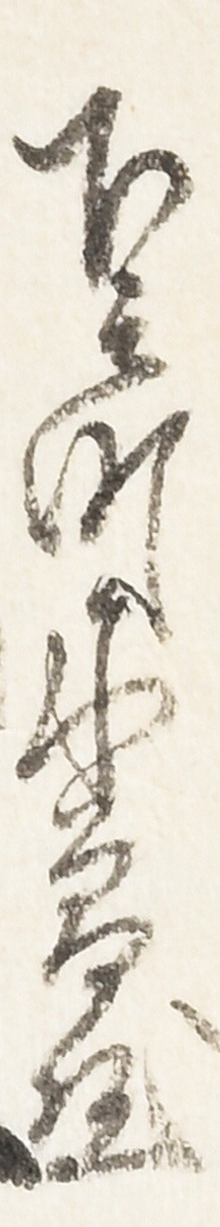下モ町木曽屋
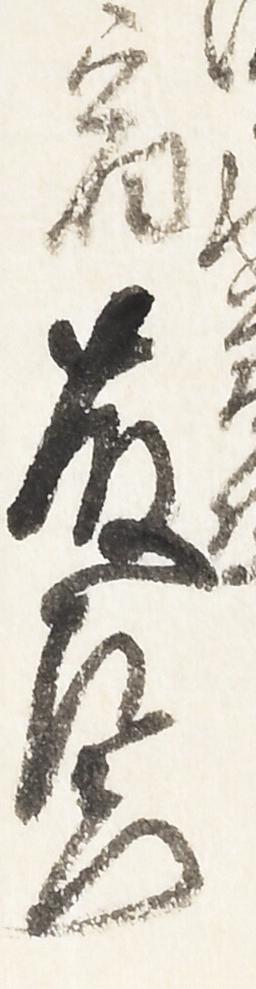宿籐左衛門
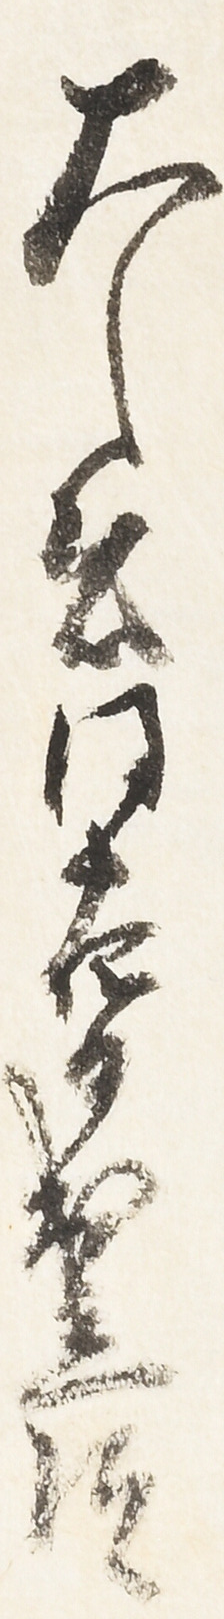右之者同十八日出立仕候
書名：旅人泊控帳
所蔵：伊那市立高遠町図書館・合同会社AMANE
